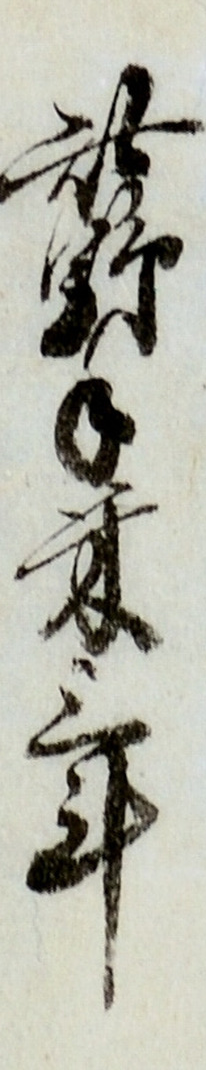此野手米三斗
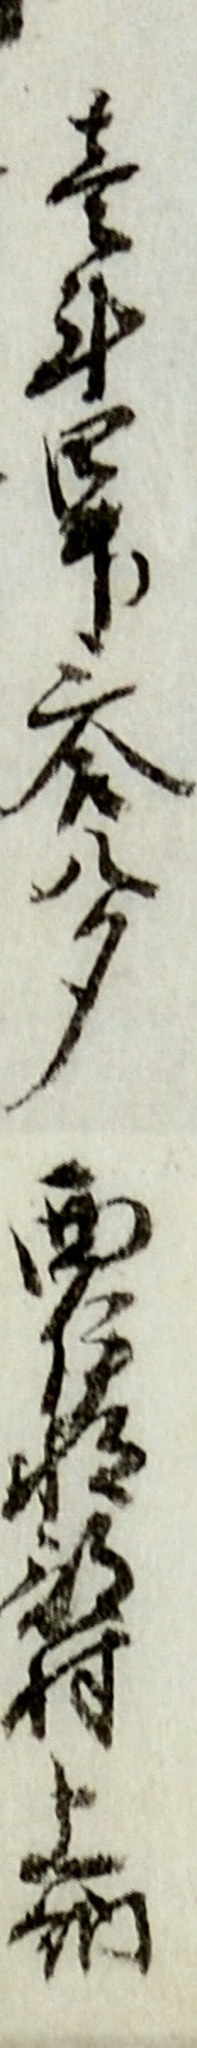壱斗四升三合八勺西伊那部村上納
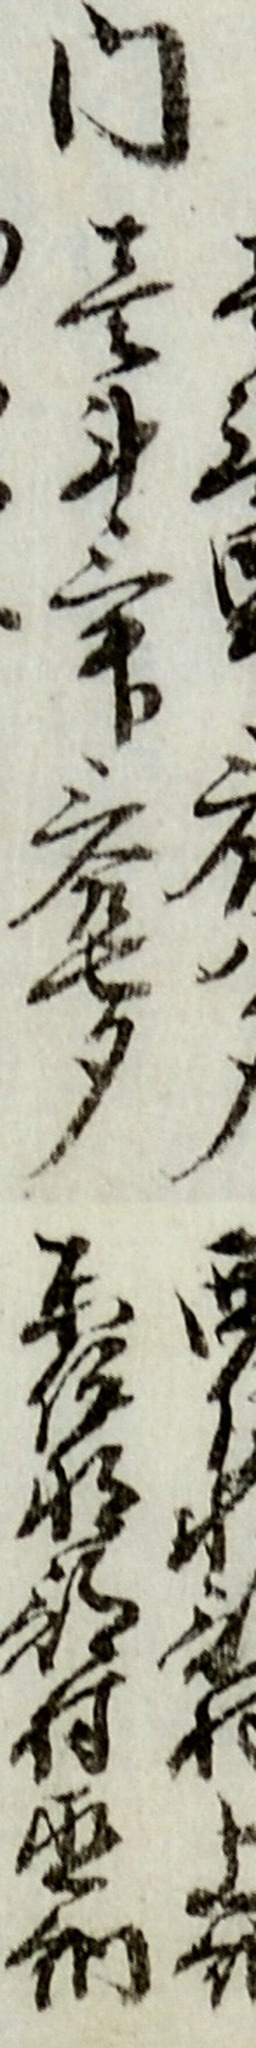内壱斗三升三合七勺東伊那部村直納
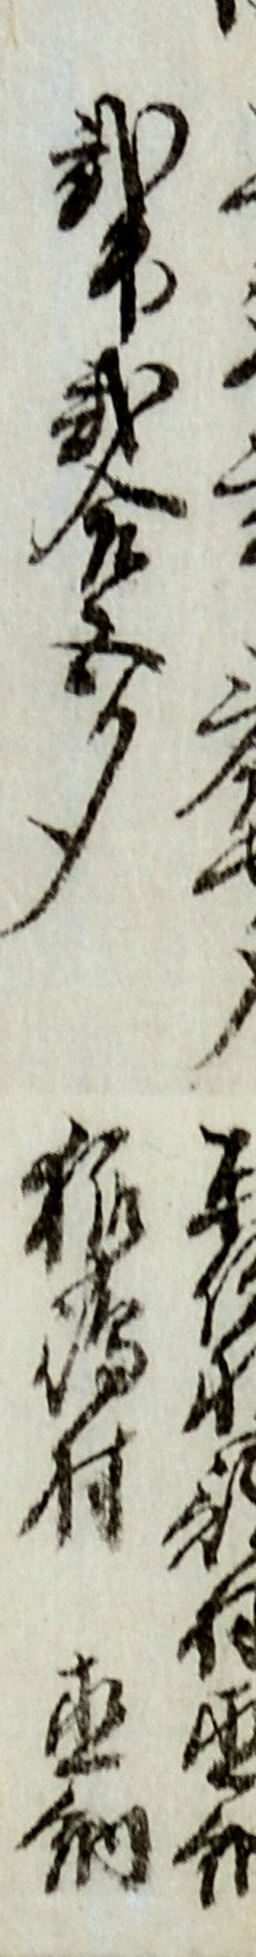弐升弐合五勺狐島村直納
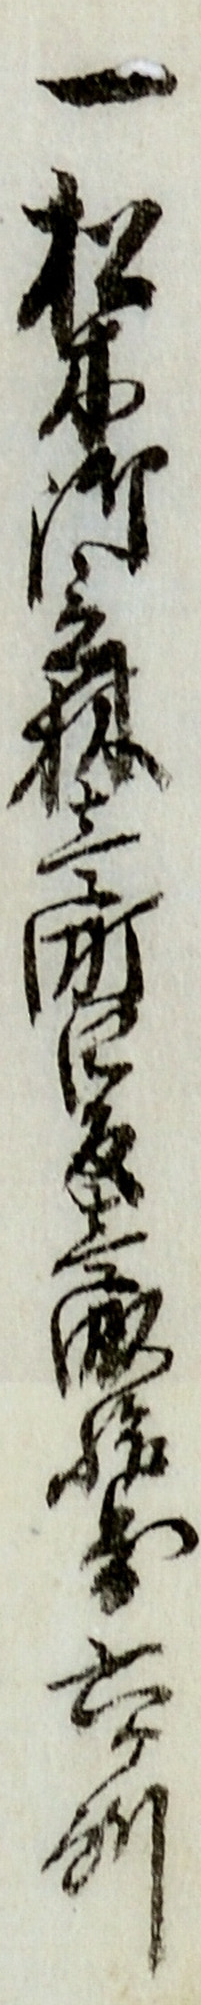一松木御立林壱町四反壱畝拾歩六ヶ所
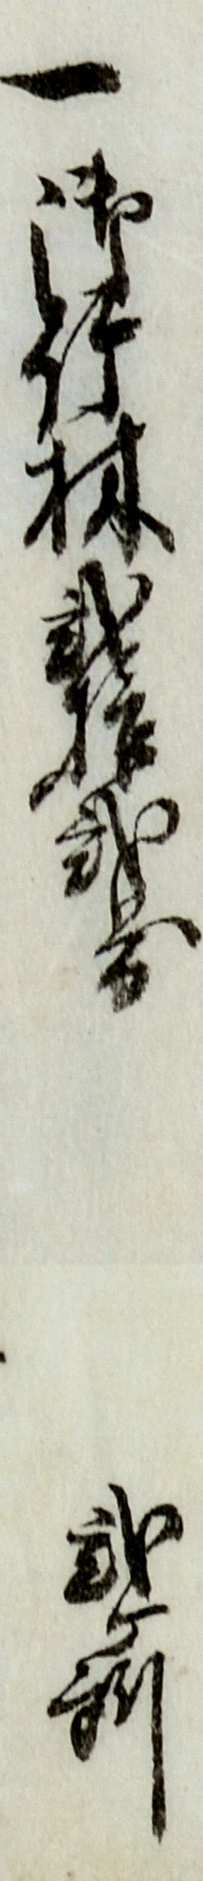一御竹林弐拾弐歩弐ヶ所
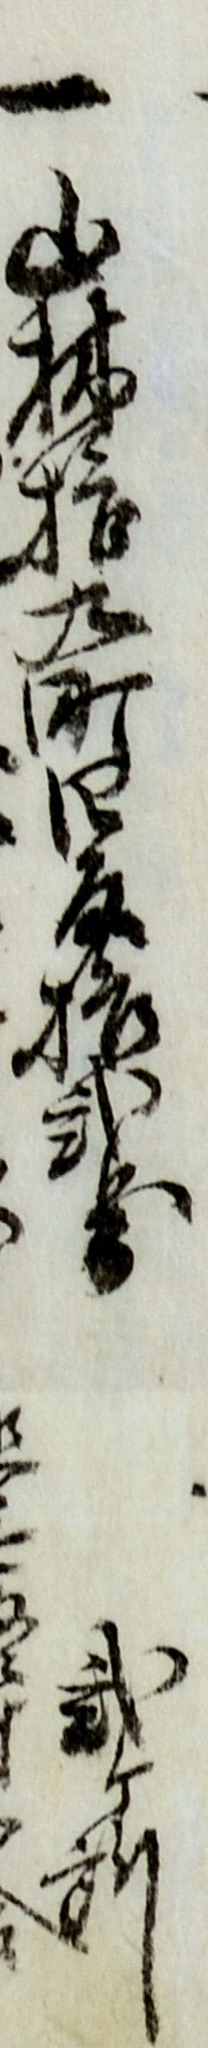一山林拾九町四反拾弐歩弐ヶ所
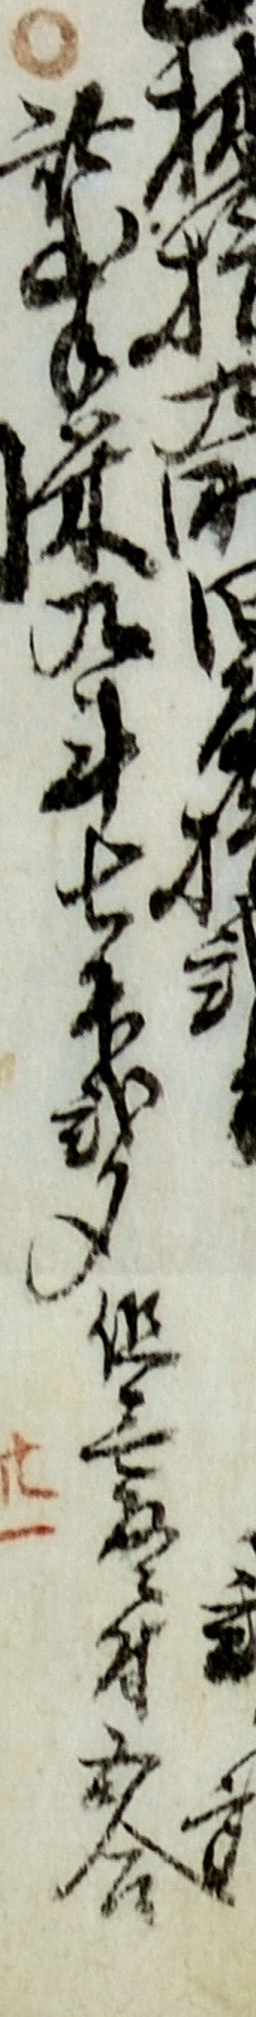○此山手米九斗七升弐勺但壱反ニ付五合

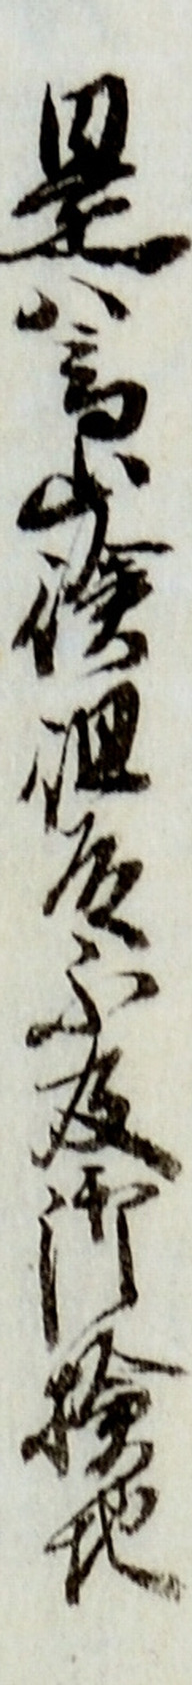是ハ高山嶮岨故不及御検地
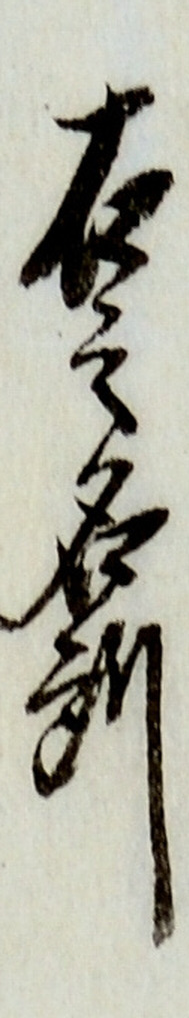右之名所
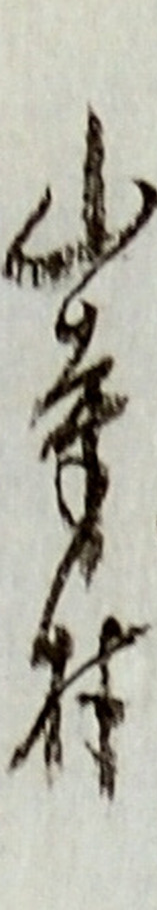山寺村
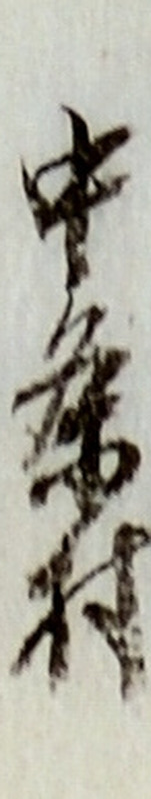中条村
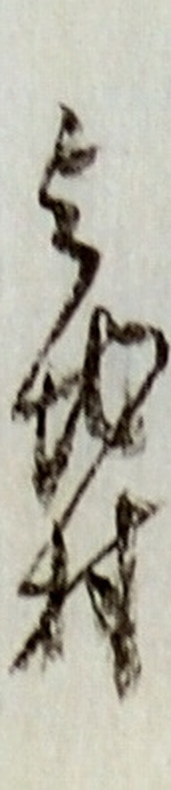与地村

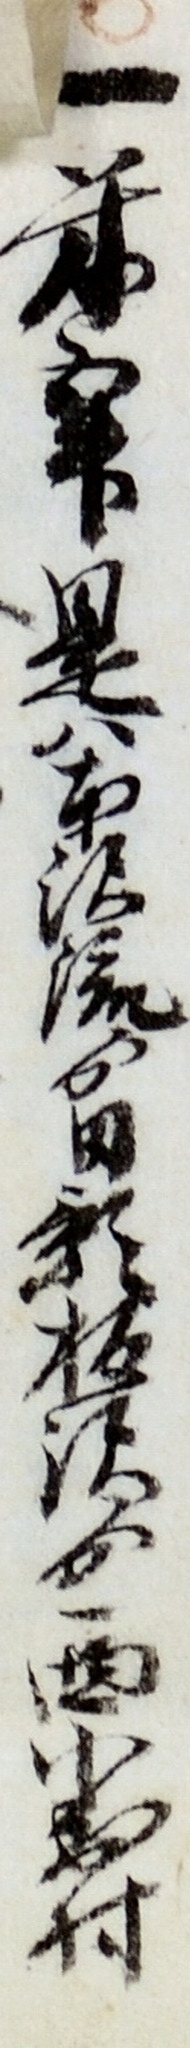○一米五升是ハ本沢流より日影板沢ゟ西小出村
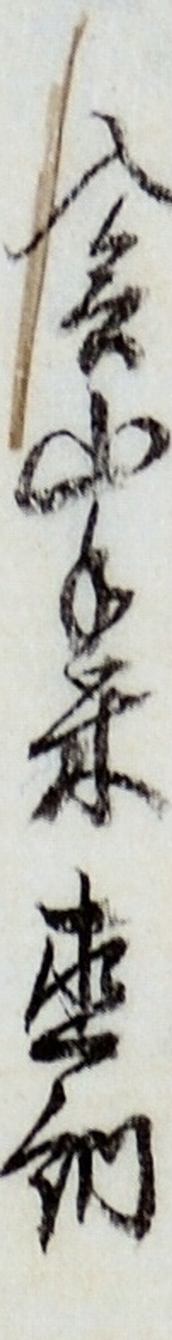入会山手米直納

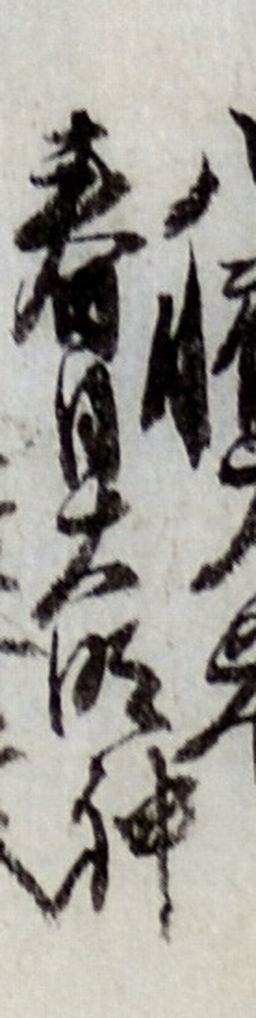春日大明神
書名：御領分中山林社地手控
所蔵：伊那市立高遠町図書館・合同会社AMANE
